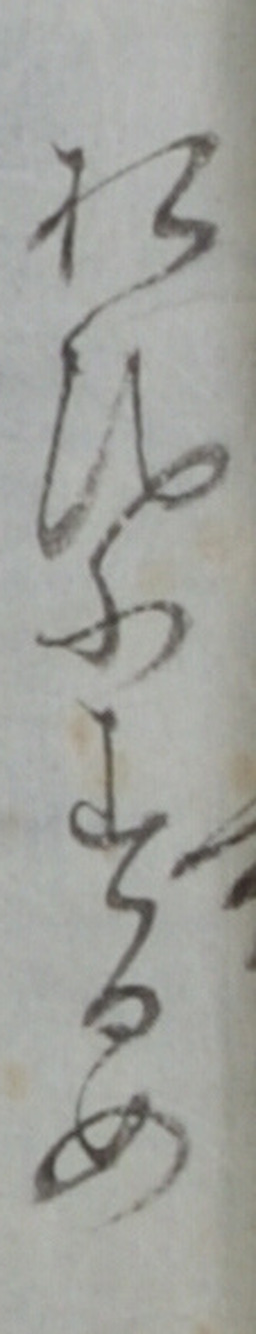松葉するめ
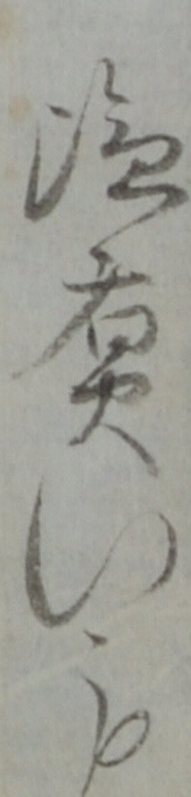塩煮いも
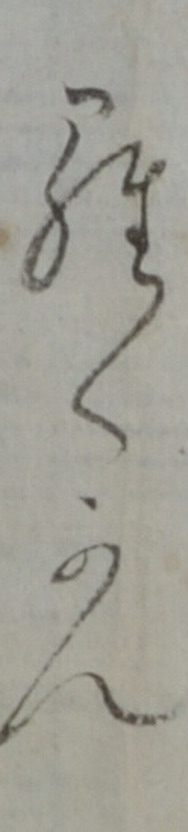らくかん
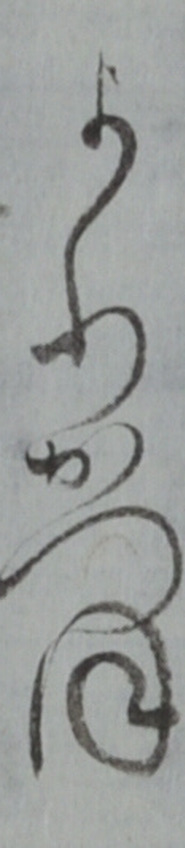よりかつほ
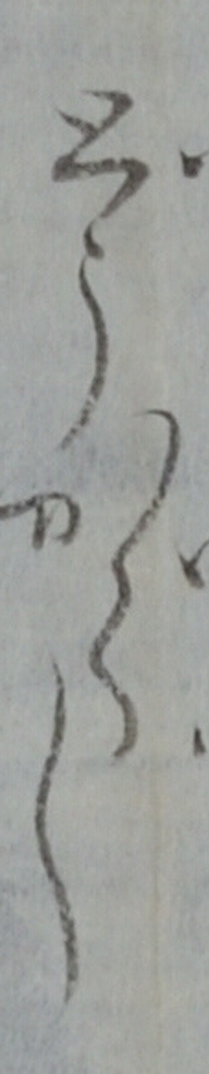とうからし
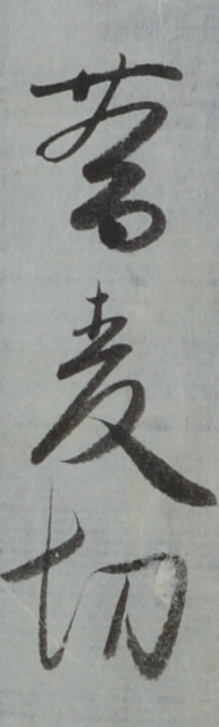蕎麦切
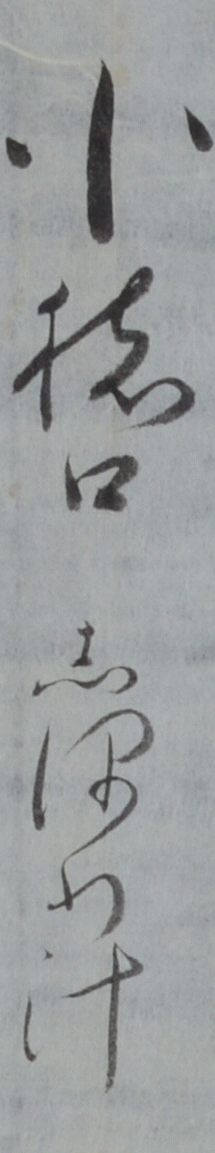小猪口しほり汁

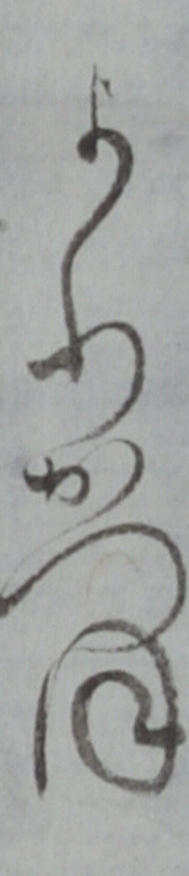よりかつほ
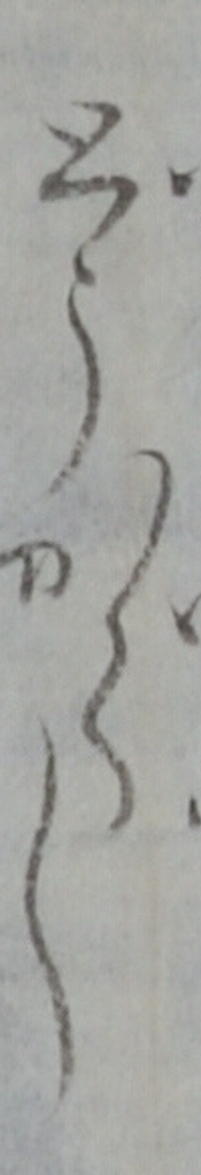とうからし
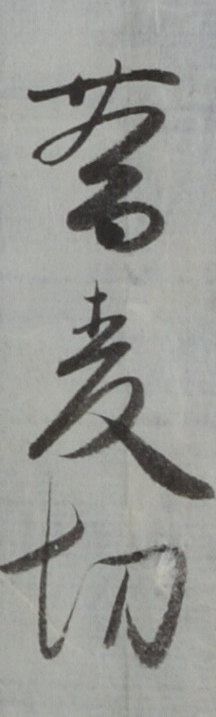蕎麦切
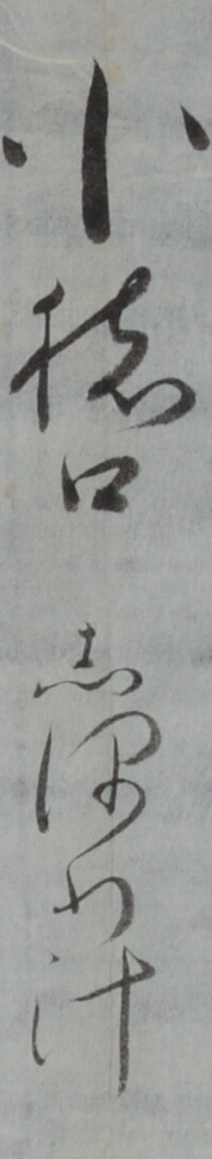小猪口しほり汁
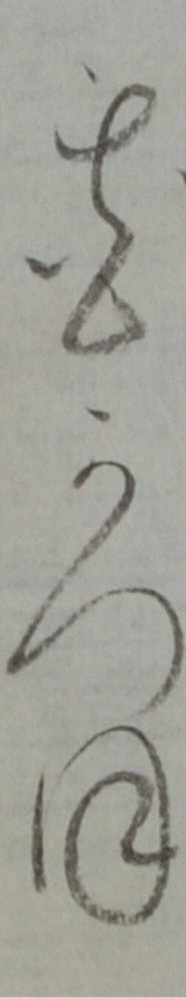花かつほ

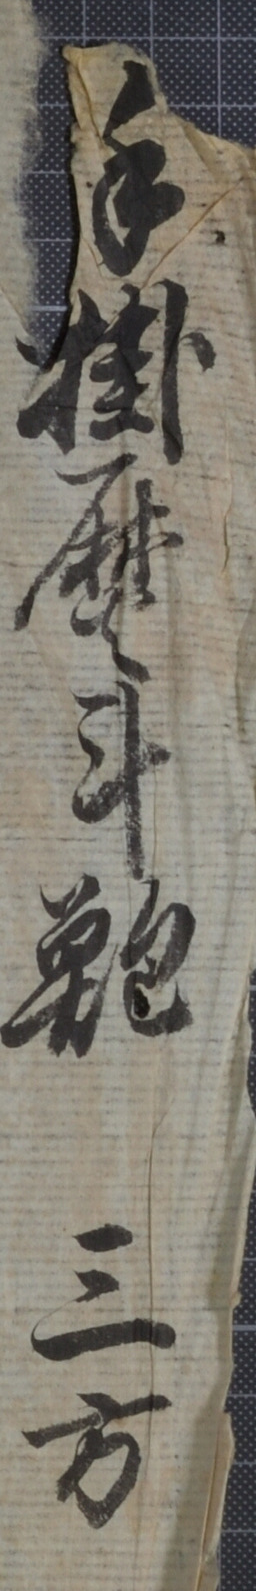手掛熨斗鮑三方
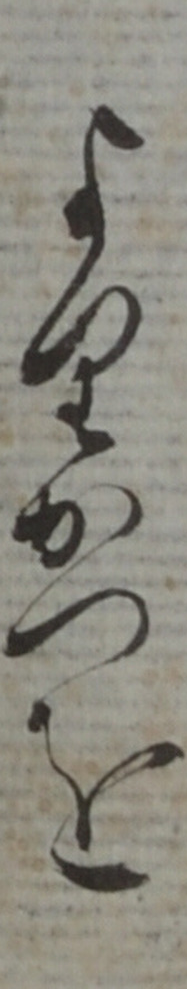よりかつを
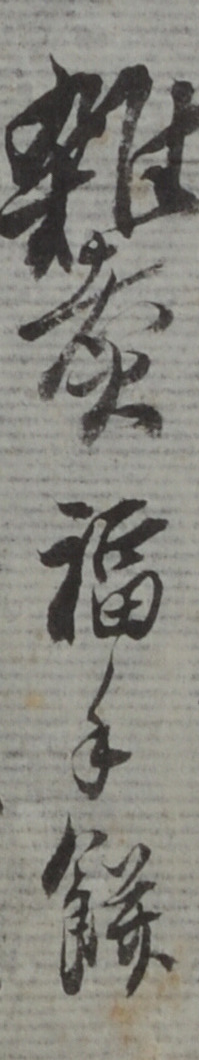雑煮福手餅
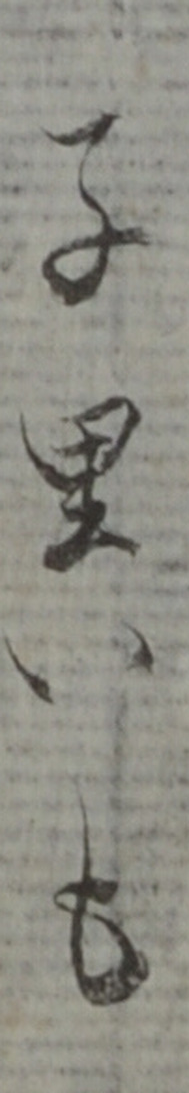子里いも
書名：献立書上
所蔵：伊那市立高遠町図書館・合同会社AMANE
